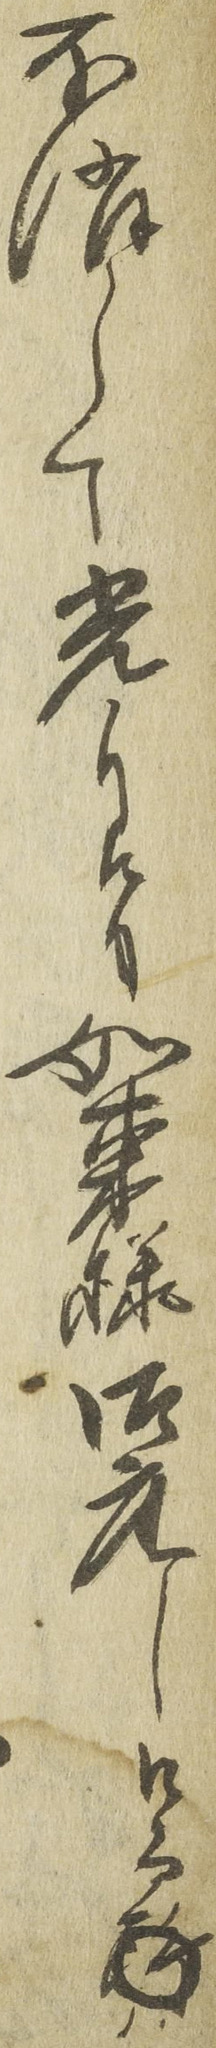不消して光りけり如来様御座しける
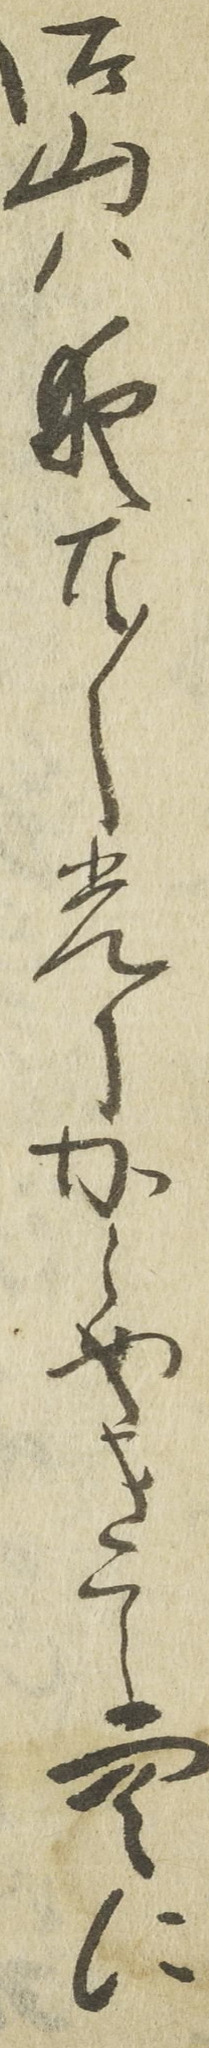御山は夜な〳〵光りかゝやきて空に
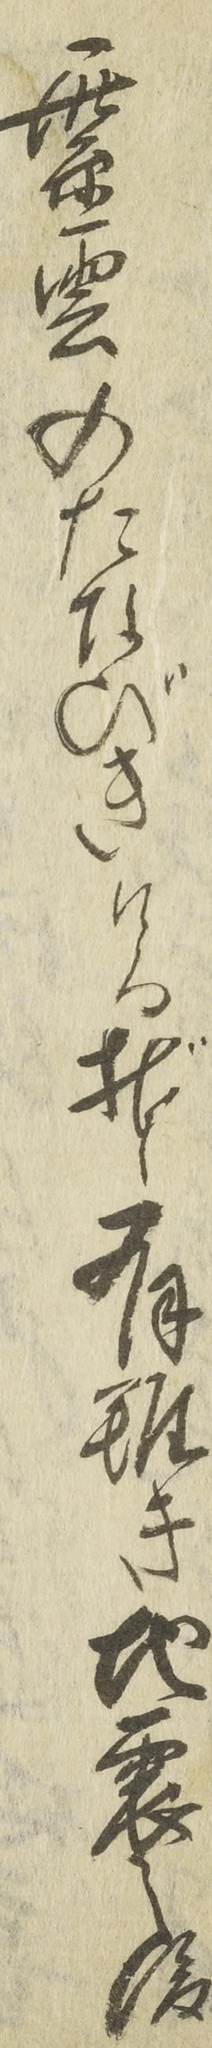紫雲のたなびきけるぞ有難き地震の後
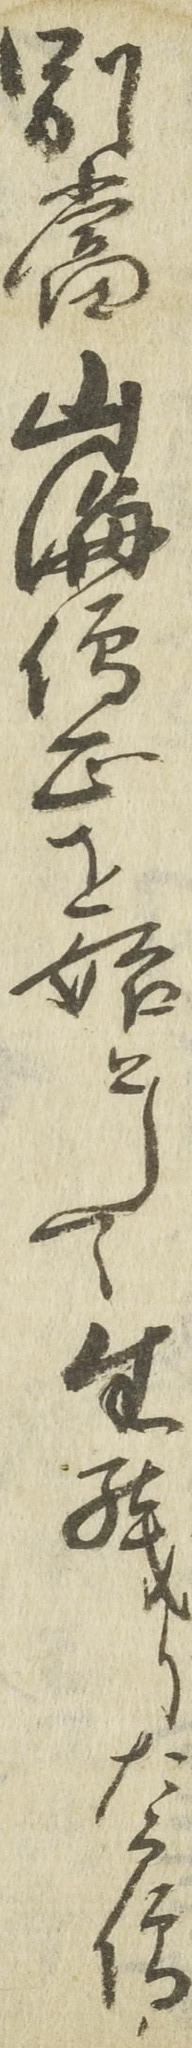別当山海僧正を始として生残りたる僧
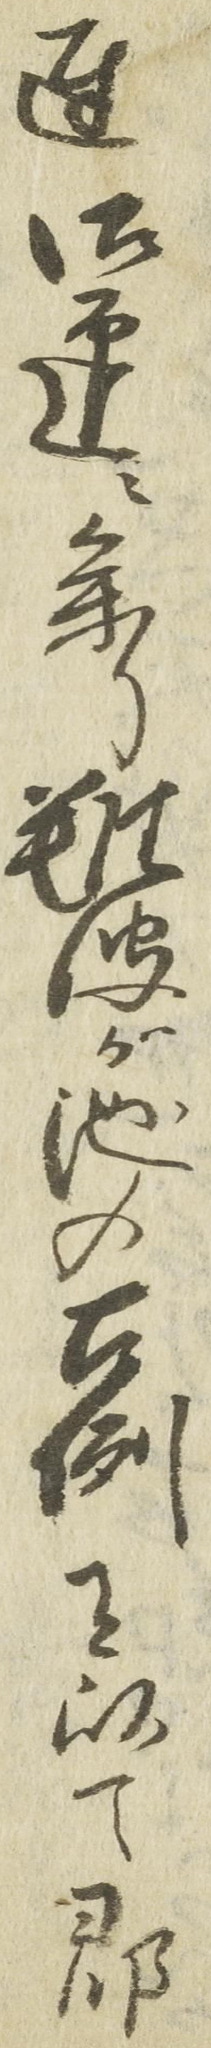達御迎ニ参り難波が池の古例を以て即
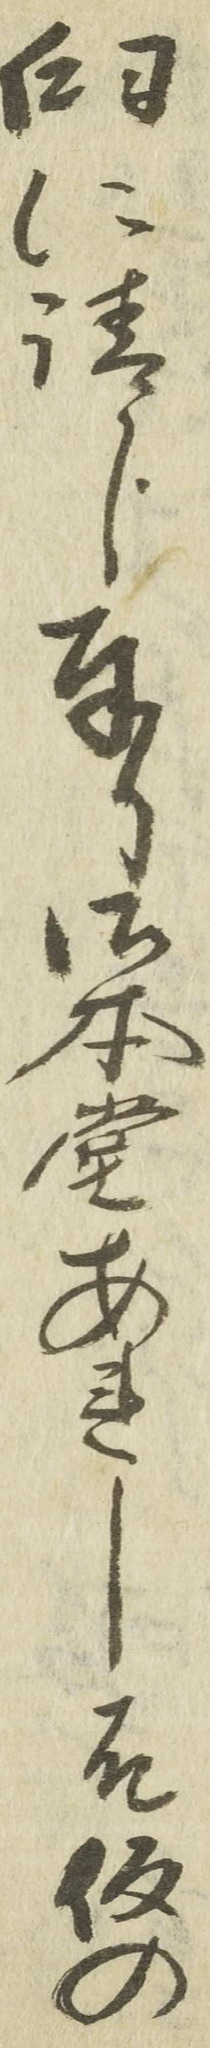的に請じ奉り御本堂あれし故仮の
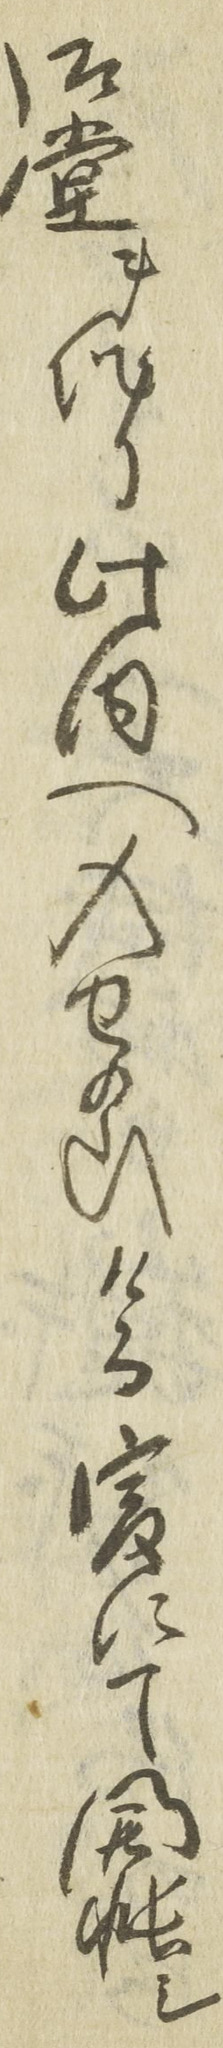御堂ヲ作り此内へ入せ給ひける爰にて開帳シ
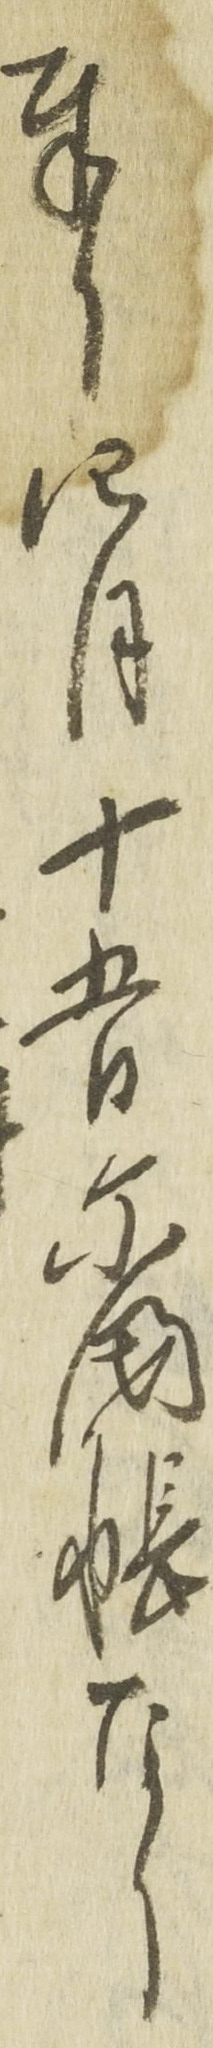奉り四月十五日に閉帳なり
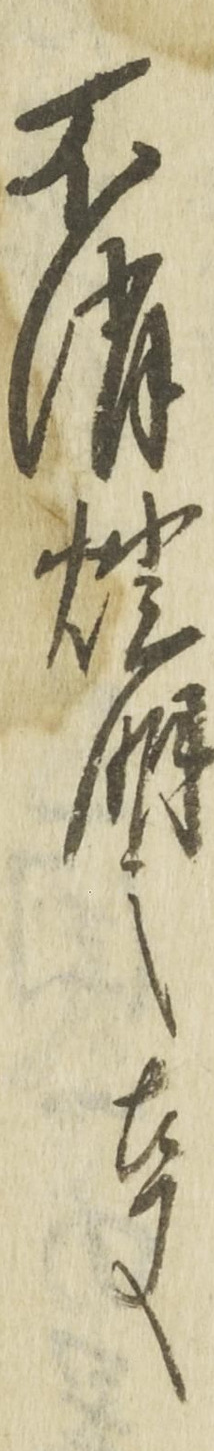不消灯明之事
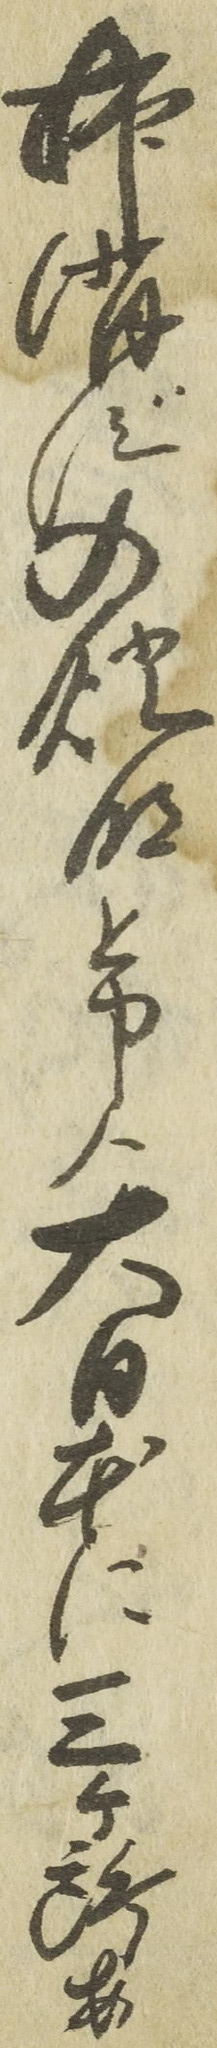抑消ずの灯明と申は大日本に三ヶ所あ
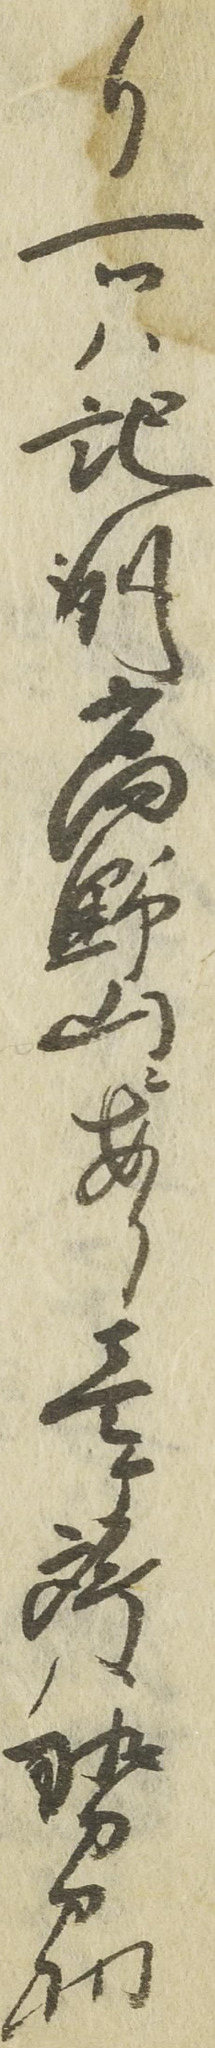り一ツは記州高野山ニあり壱ヶ所は勢州
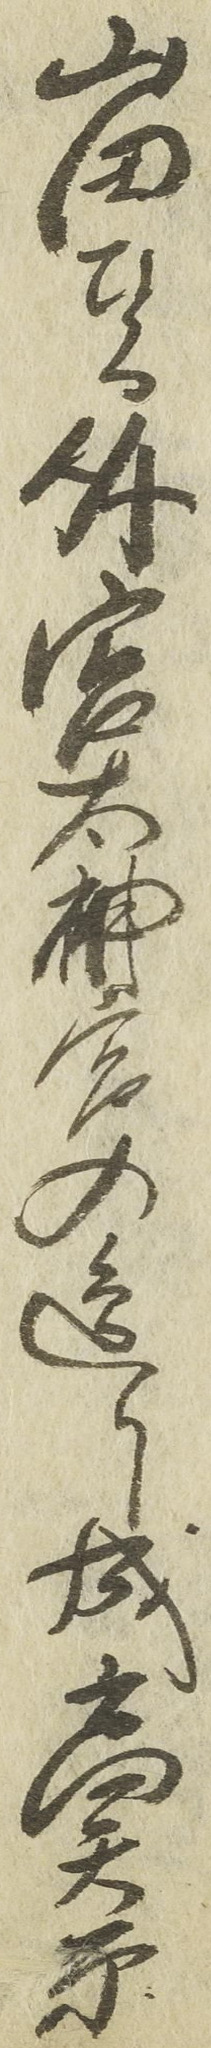山田なる外宮太神宮の辺り成高天原
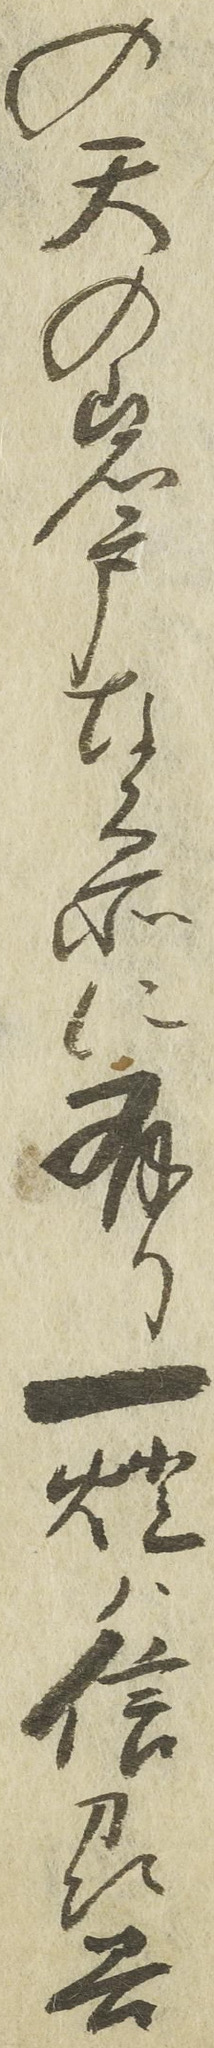の天の岩戸なる所に有り一灯は信州善
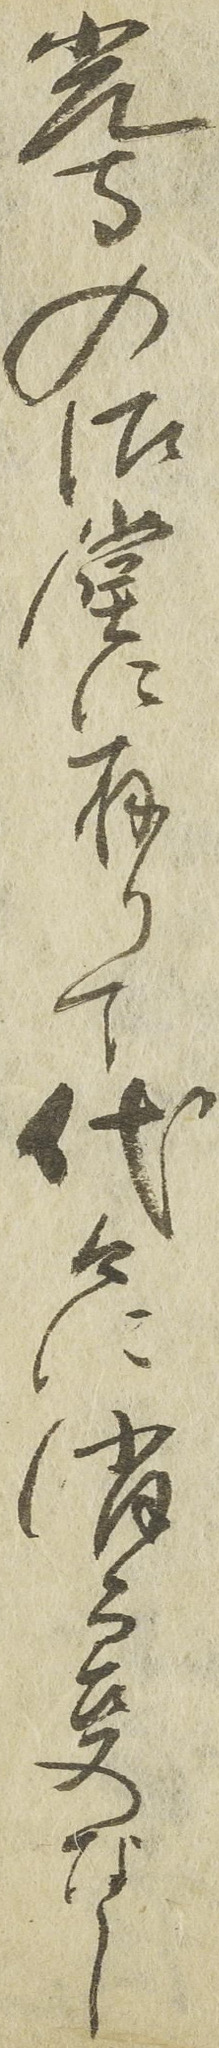光寺の御堂に有りて代々に消る事なし
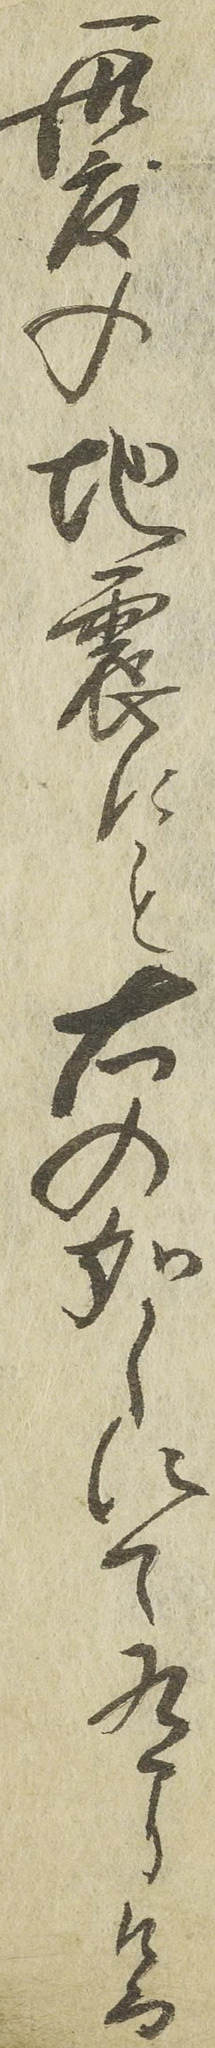此度の地震にも右の如くにて有りける
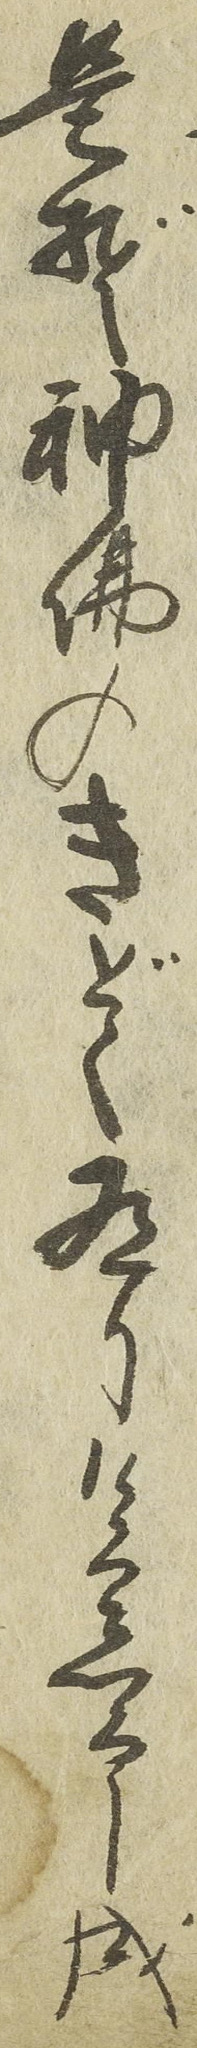是ぞ神仏のきどく有りけるしるし成
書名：善光寺地震聞書
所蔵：東京大学地震研究所図書室 Earthquake Research Institute Library, The University of Tokyo, JAPAN
